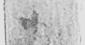十
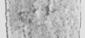四
